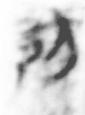邡
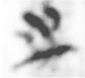之
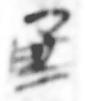爲
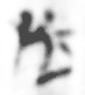○（左）
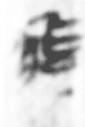飛（騑）
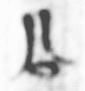公
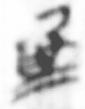爲
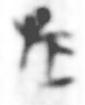○（左）
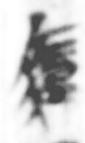驂
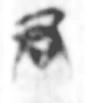君
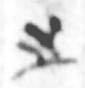之
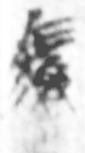亡？
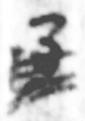爲
